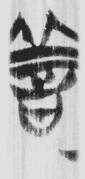善
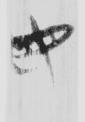母
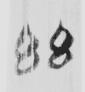𢆶
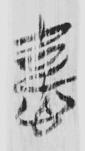愇
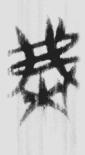柫
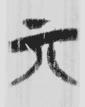亓
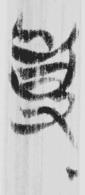事
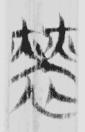勞
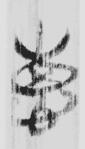惠
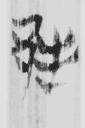邦
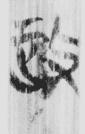政
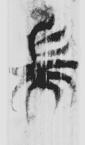耑
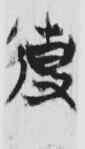𫹒
